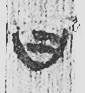曰
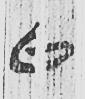㠯（以）
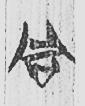同
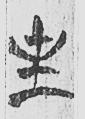生
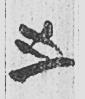之
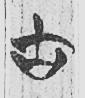古
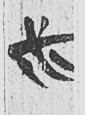必
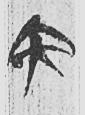內
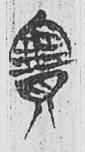賽
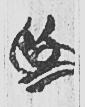爲
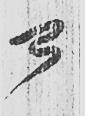乃
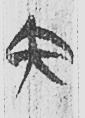內
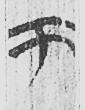于
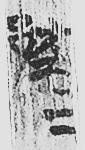○（蔡）
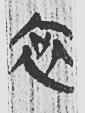哀
